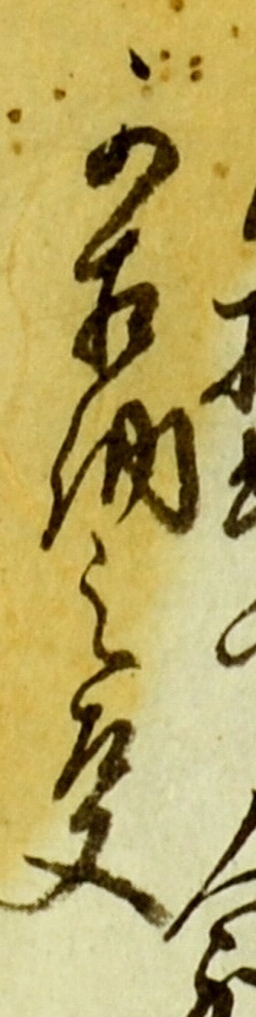可相納之事

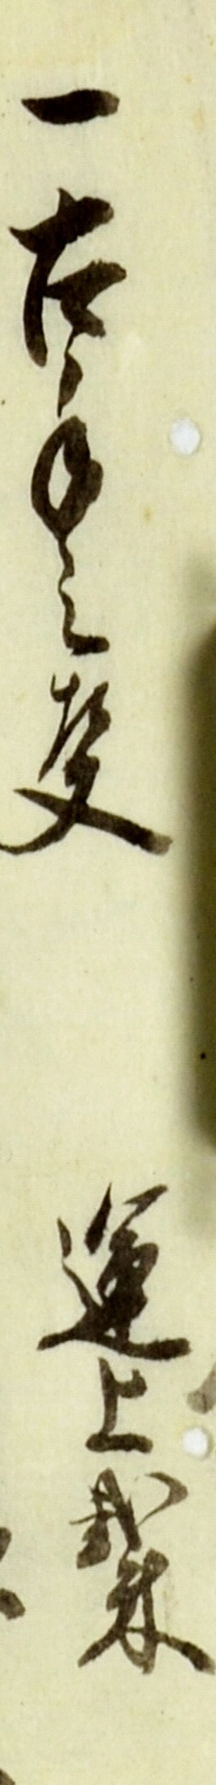一古手之事運上弐朱
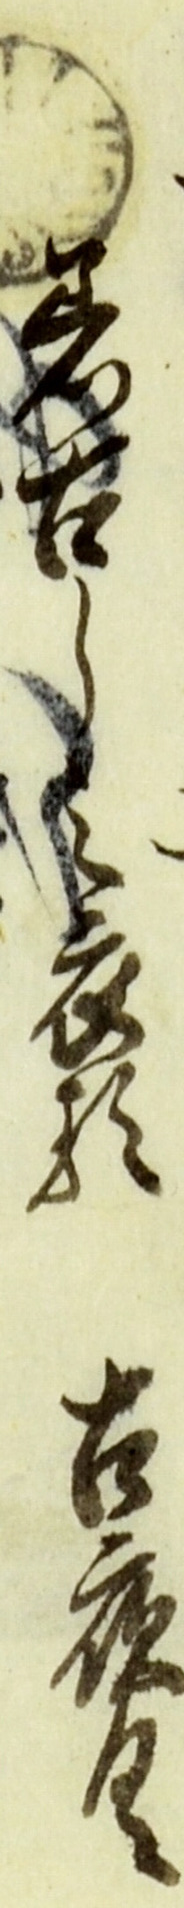着古し之衣類古夜具
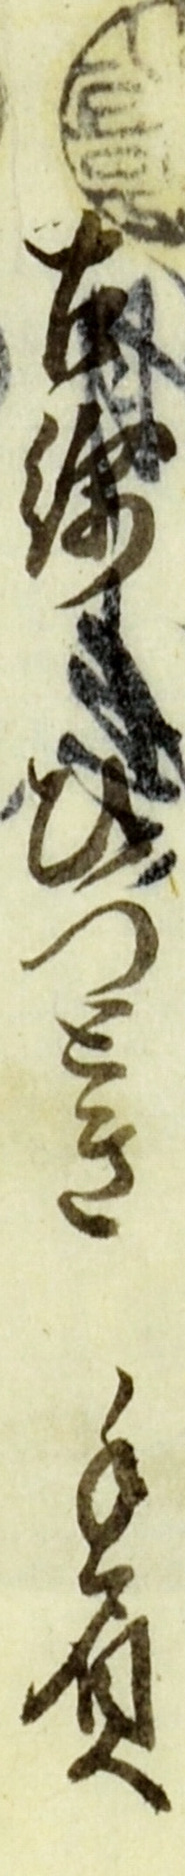古綿之ひつとき手負
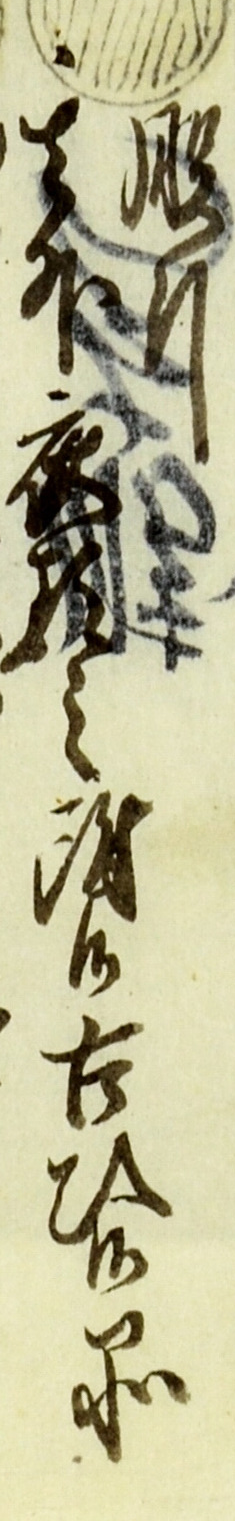其外衣類之附候古ひ候品
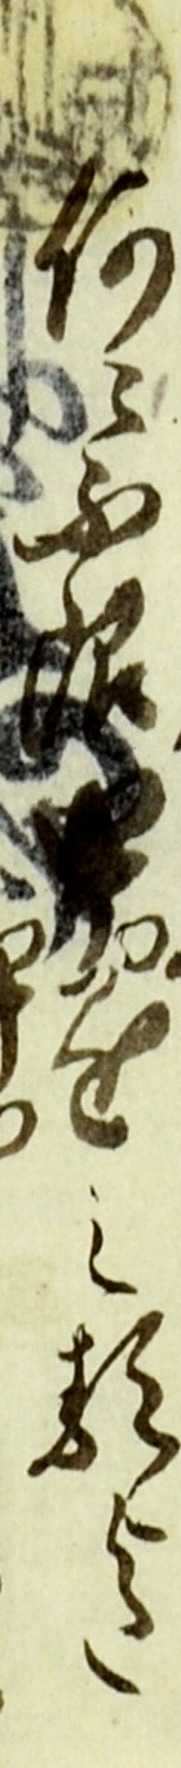何ニ不限甲懸之類迄
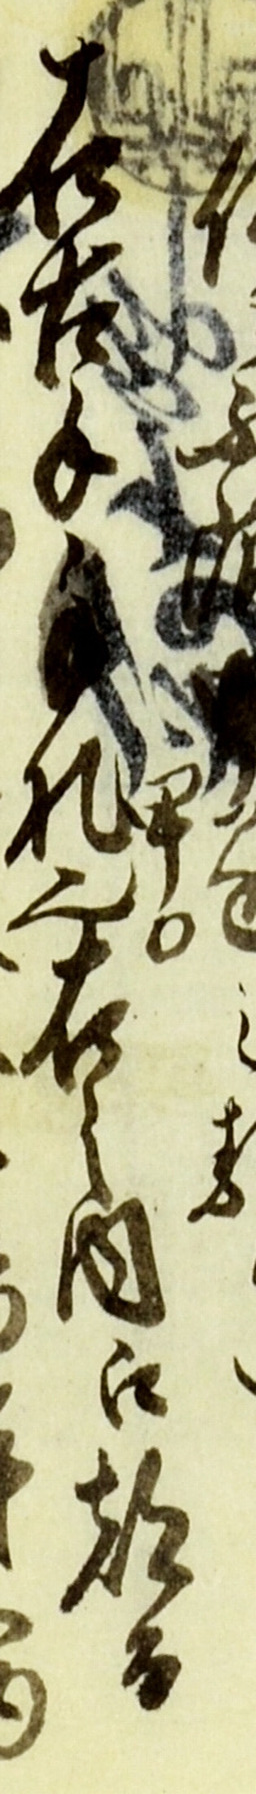右古手札也右之内江都而
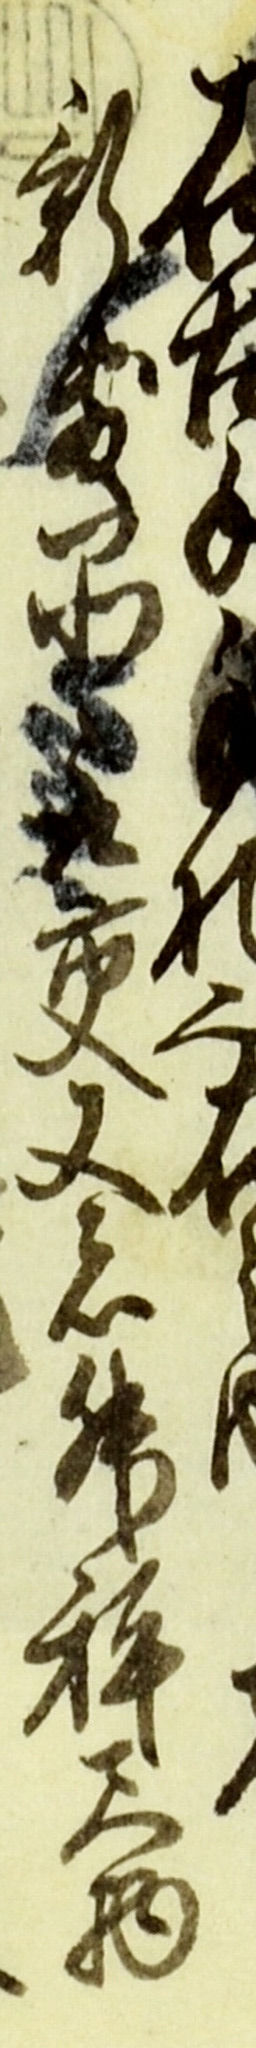新敷品取受又者升秤尺物
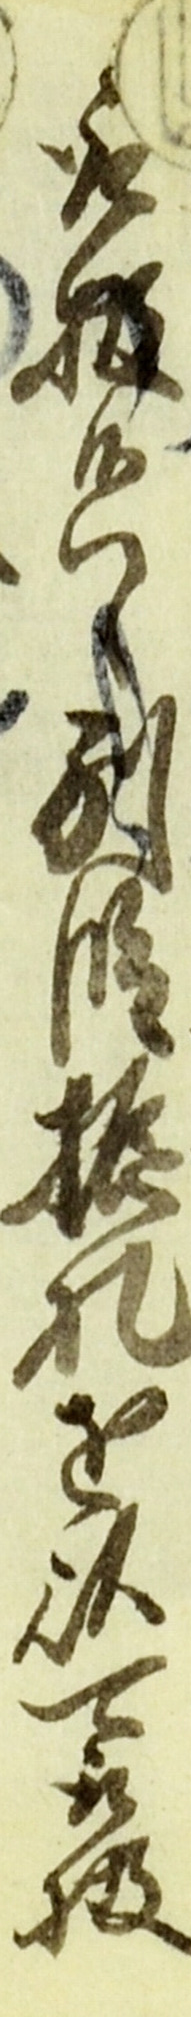取扱候ハゝ別段振札を以可取扱
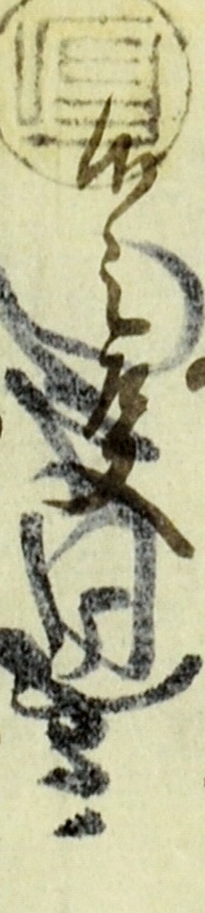候之事
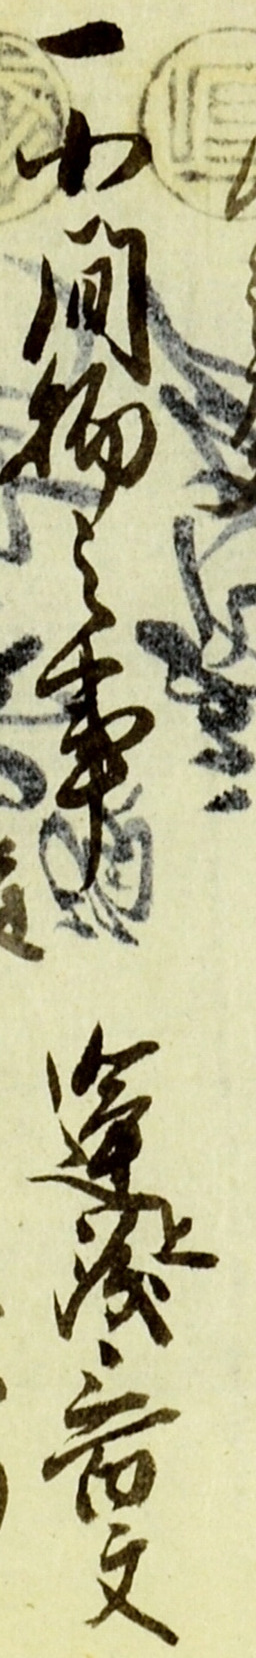一小間物之事運上銭三百文
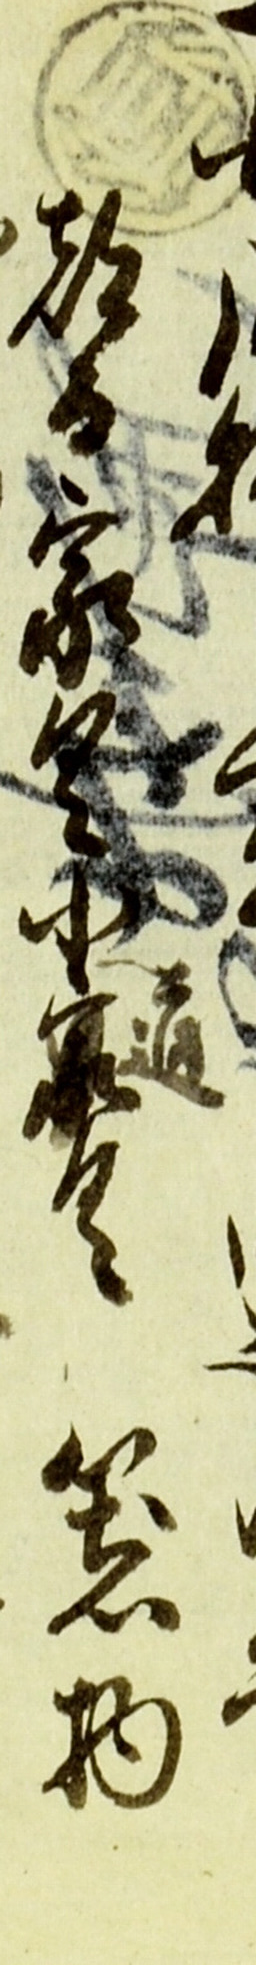都而家具小道具箸物
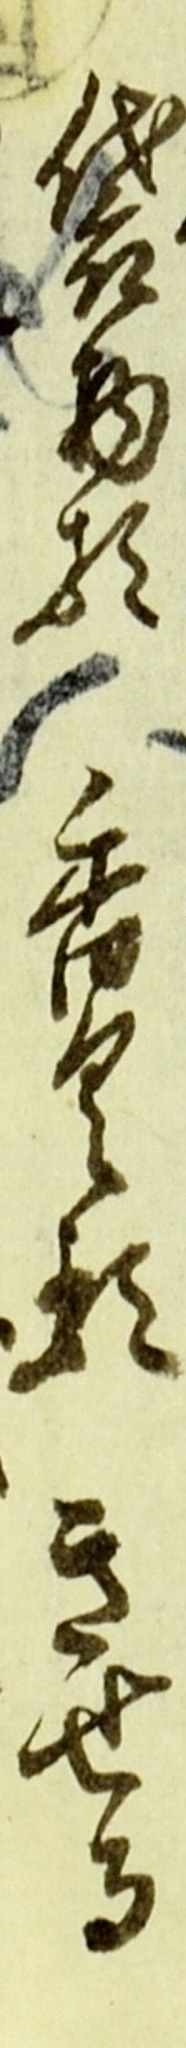袋物類香具物きせる
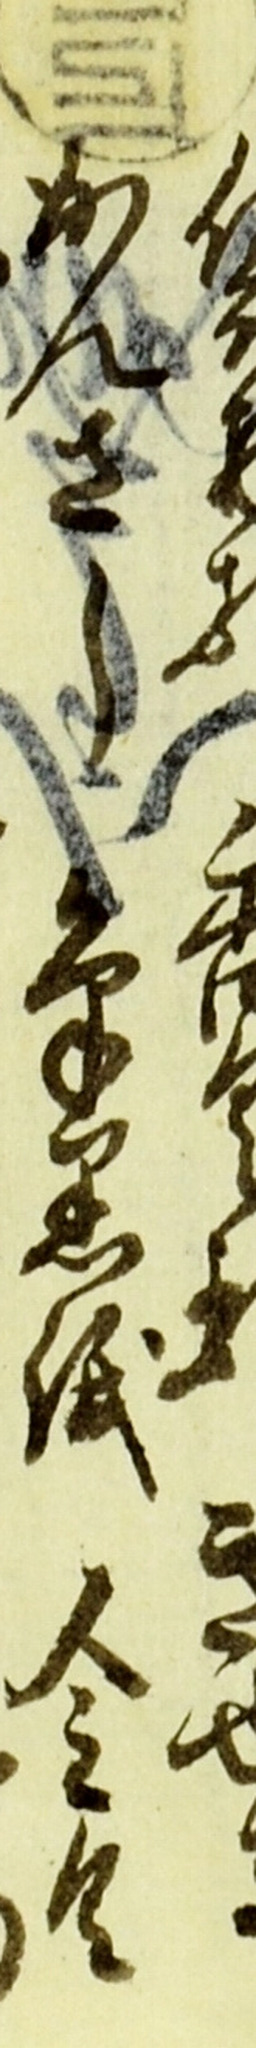かんさし筆黒紙金具
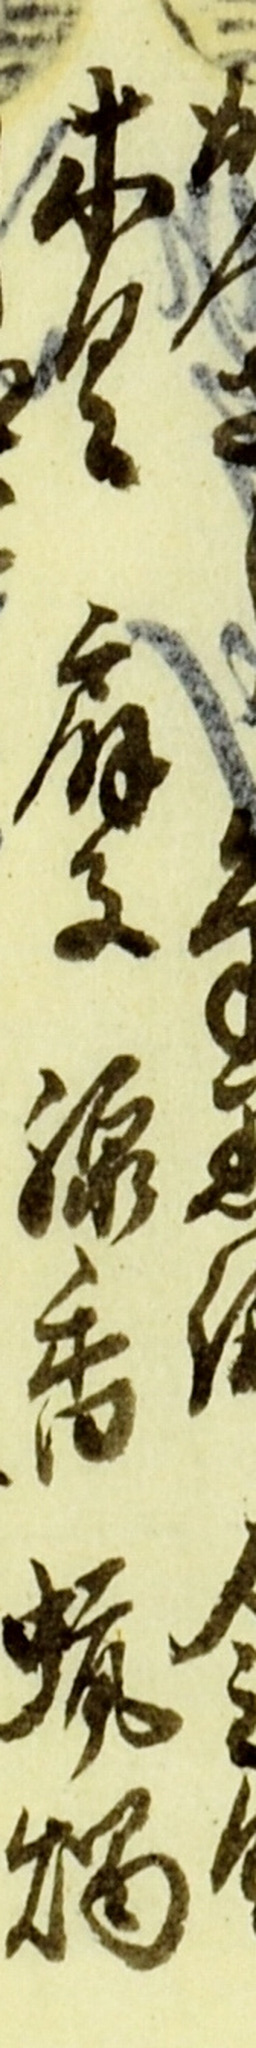木具扇子線香蝋燭
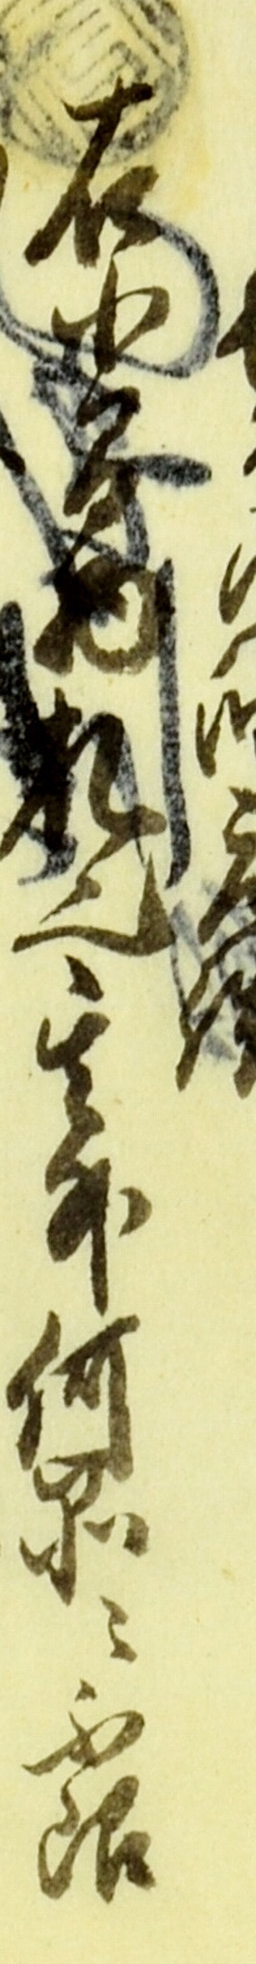右小間物札也其外何品ニ不限
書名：分一方諸運上御定法
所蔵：伊那市立高遠町図書館・合同会社AMANE
